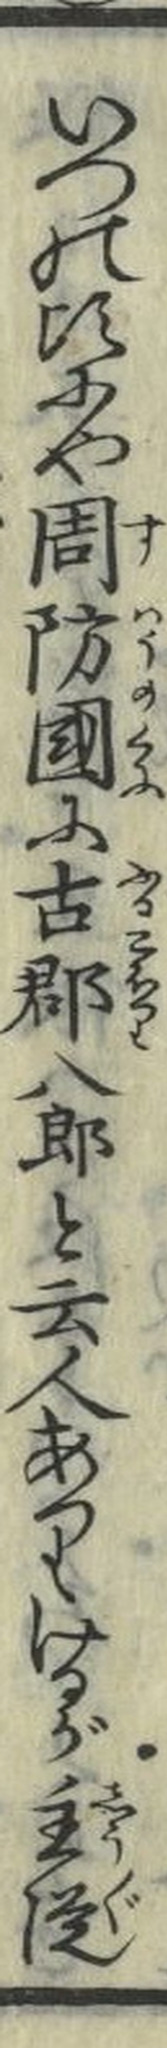いつの頃にや周防國に古郡八郎と云人ありけるが・主従
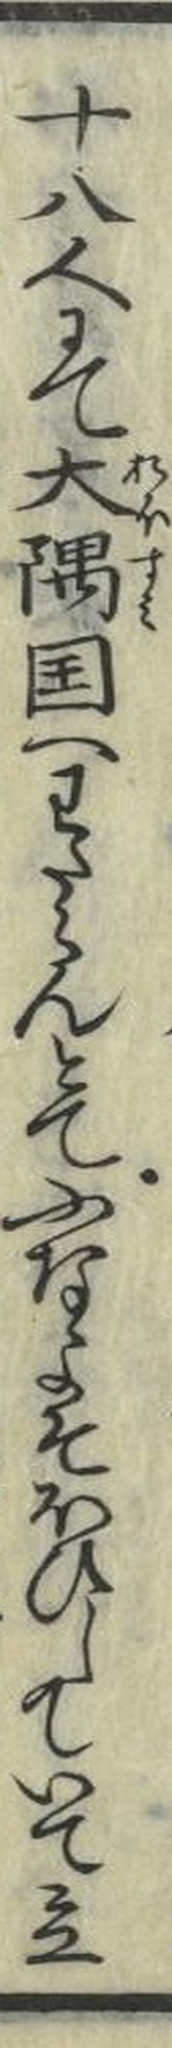十八人にて大隅国へわたらんとて・ふなよそほひしていて立
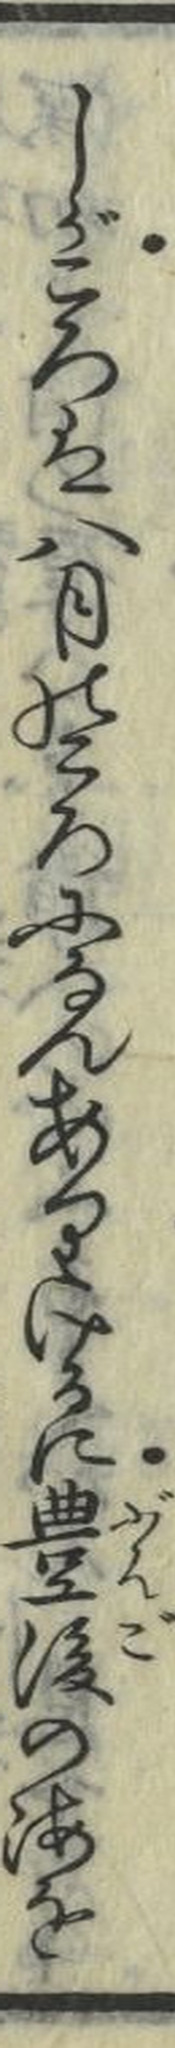しが・ころは八月のころになんありけるに・豊後の海を
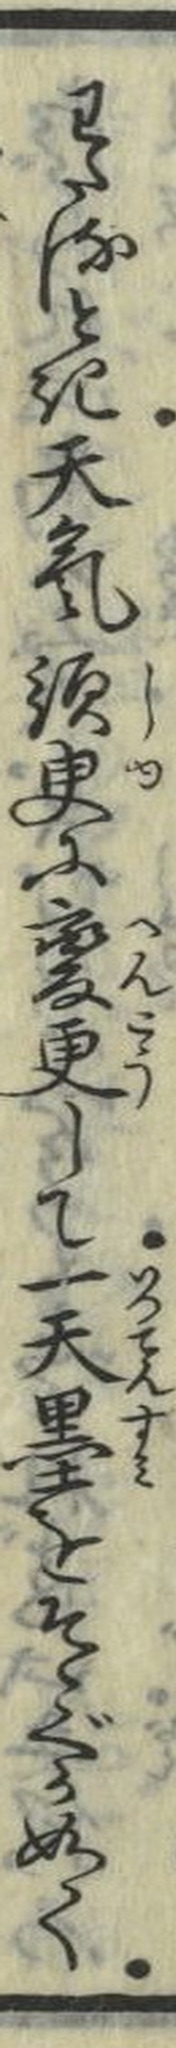わたるとき・天気須臾に変更して・一天墨をそゝぐか如く・
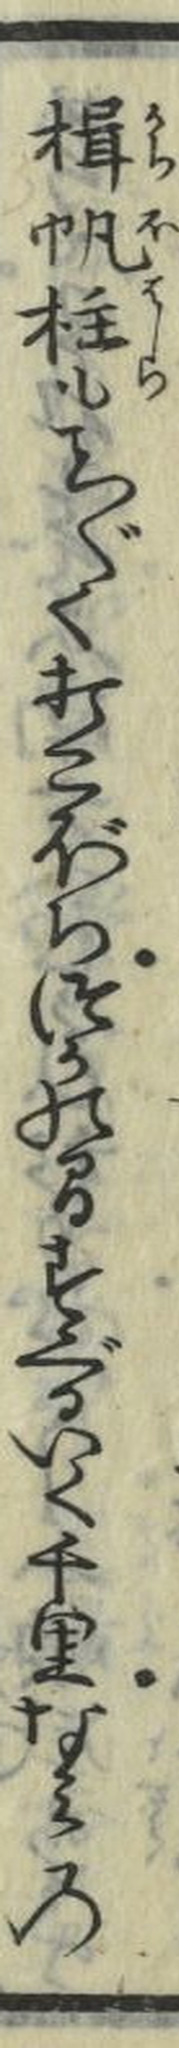楫帆柱もこと〴〵く打こぼち・つかの間すぐるいく千里・なみの
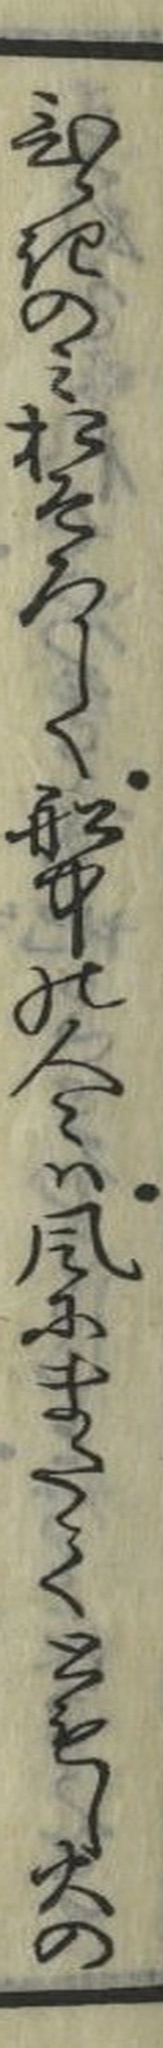ひゝきのみおそろしく・船中の人々は・風にまたゝくともし火の
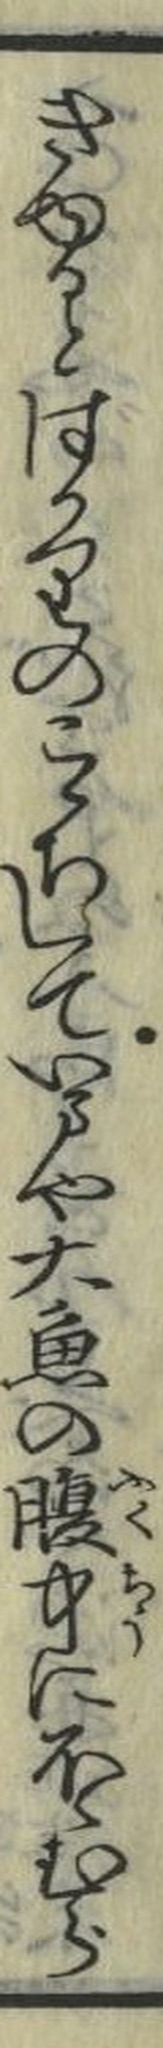きゆるとはかりのこゝちして・いまや大魚の腹中にほゝむら
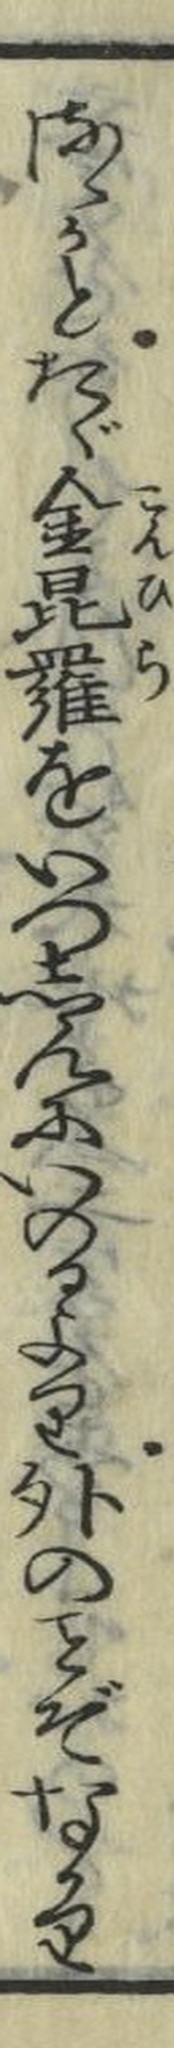るゝかと・たゞ金毘羅をいつしんにいのるより・外のことぞなかり
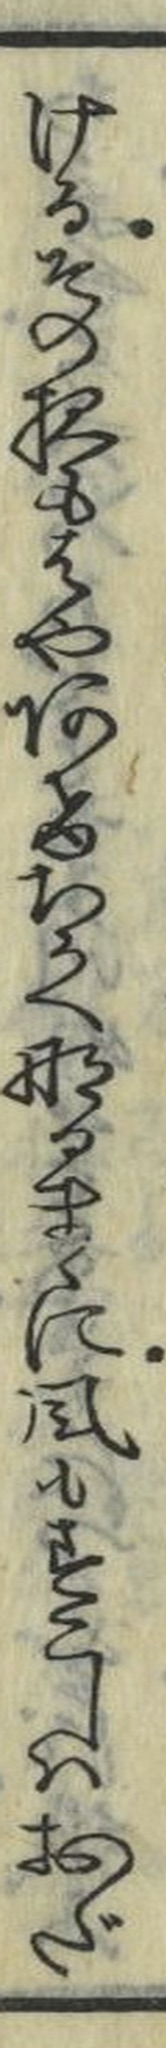ける・その夜もはやあけちかくなるまゝに・風もすこしはおだ
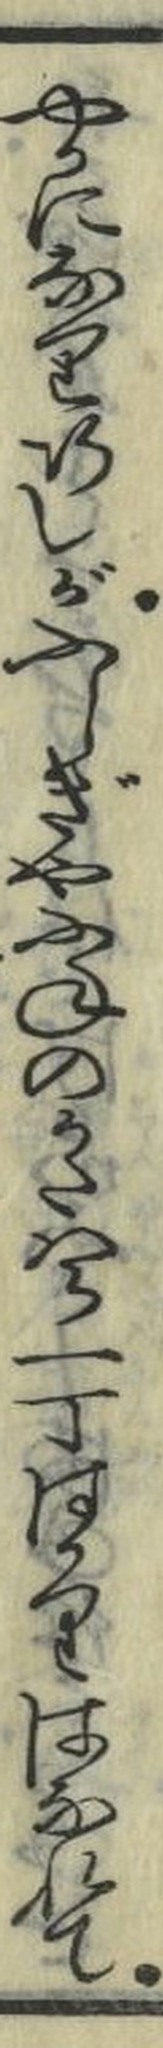やかになり行しが・ふしぎやふねのかたはら一丁はかりはなれて・
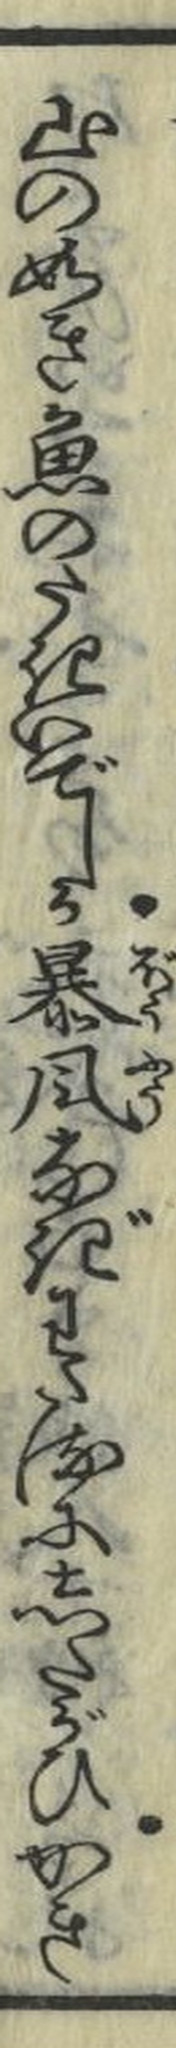山の如き魚のうきいでしか・暴風なぎわたるにしたがひ・かき
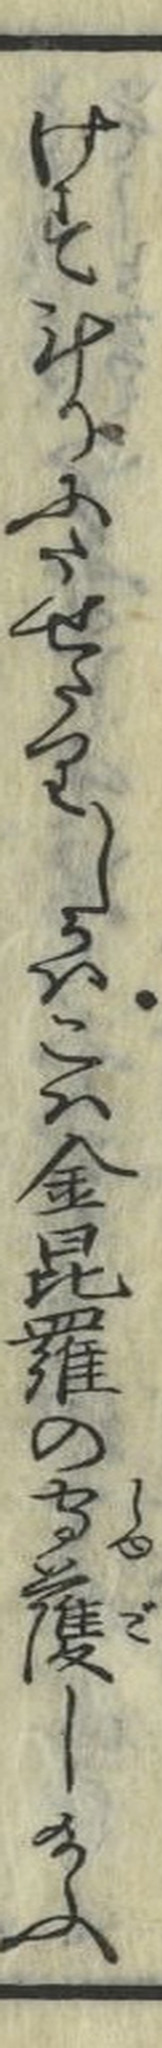けす斗りにうせたりしかは・こは金毘羅の守護し給ふ

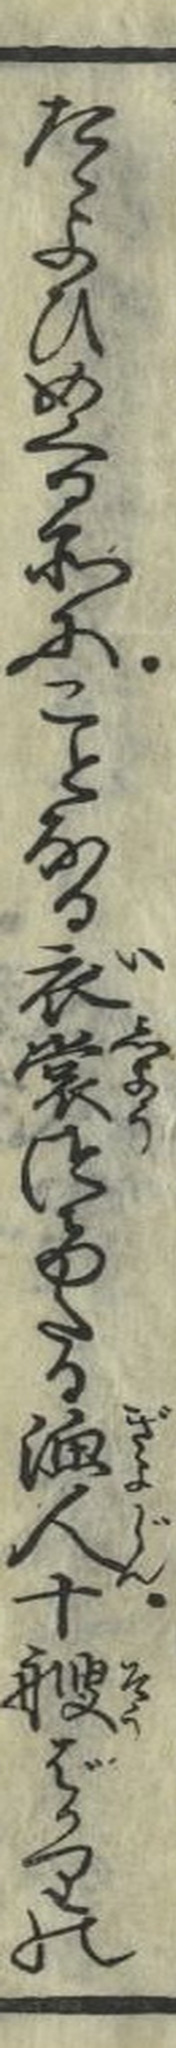たたよいめくる所に・ことなる衣裳つけたる漁人・十艘ばかりの
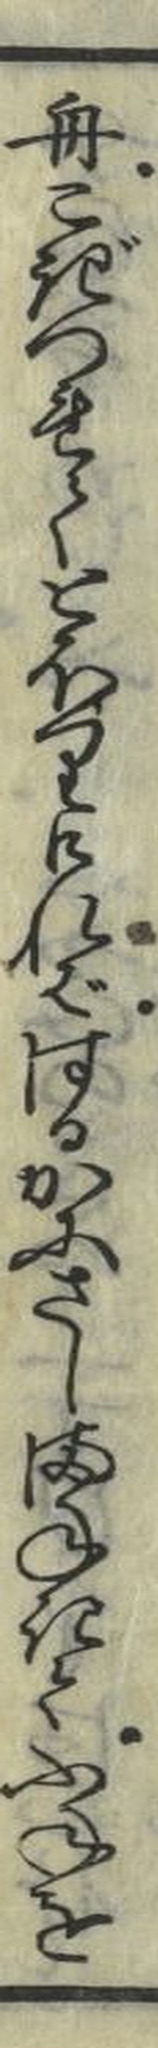舟・こぎつれてとほりければ・はるかにさしまねきて・ふねを
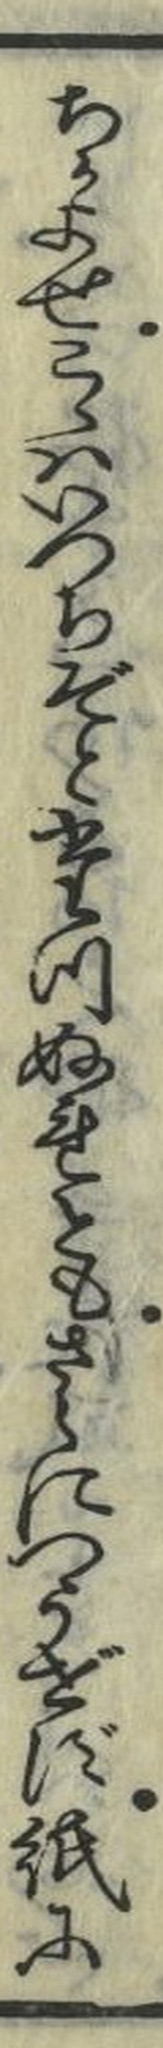ちかよせ・こゝはいつちぞとたつぬれとも・さらにつうぜず・紙に
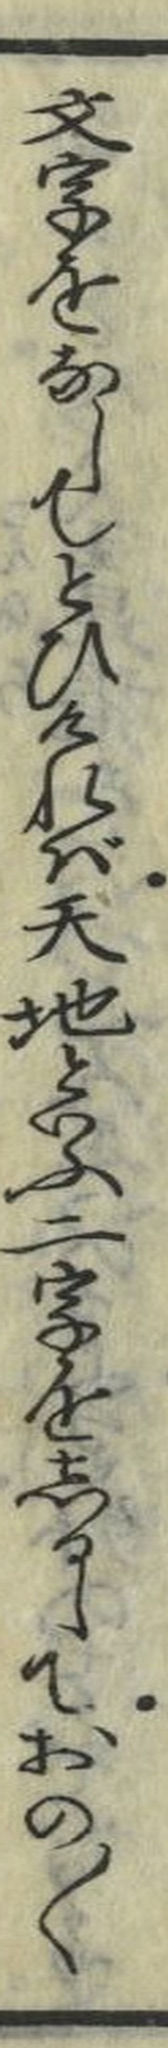文字をなしてとひければ・天地といふ二字をしるして・おの〳〵
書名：琉球秊代記 附雑話 全
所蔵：University of the Ryukyus Library
